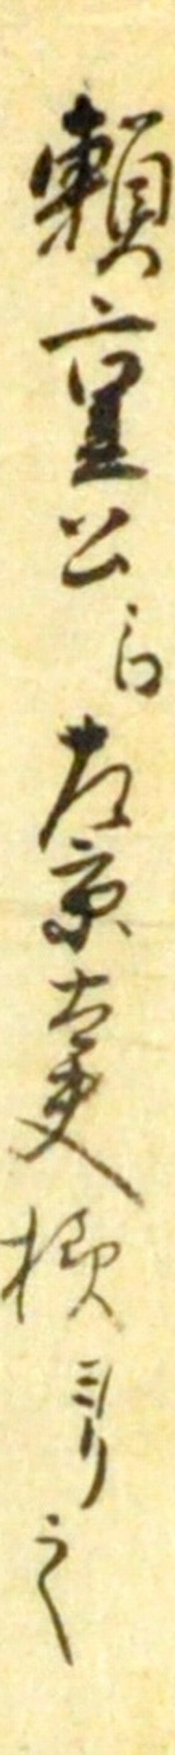頼重公え左京太夫様ヨリ之
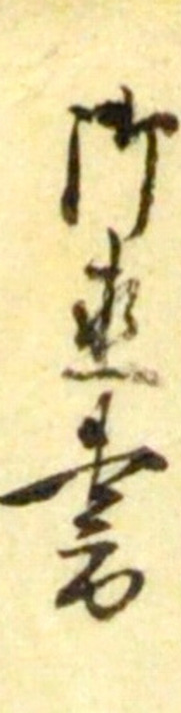御直書

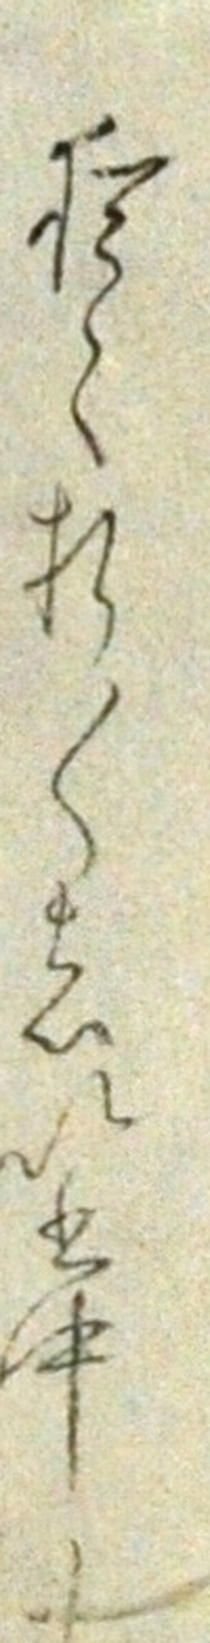猶々折〳〵は以書中も
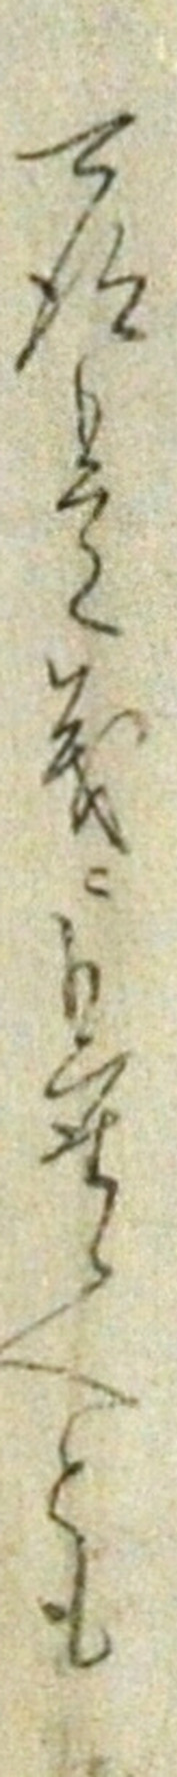可得御意義に御座候へとも
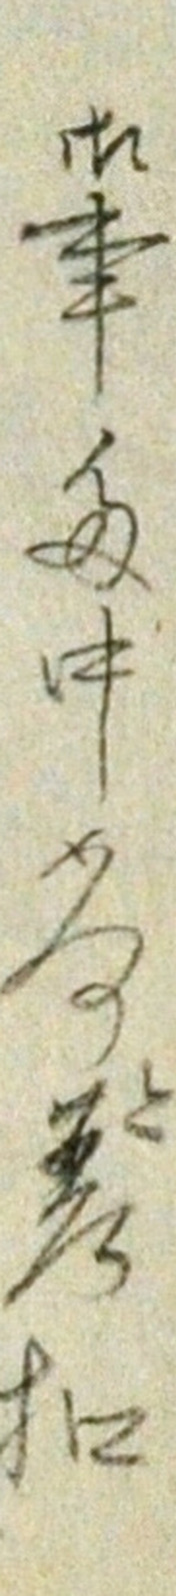御事多中如何と差控
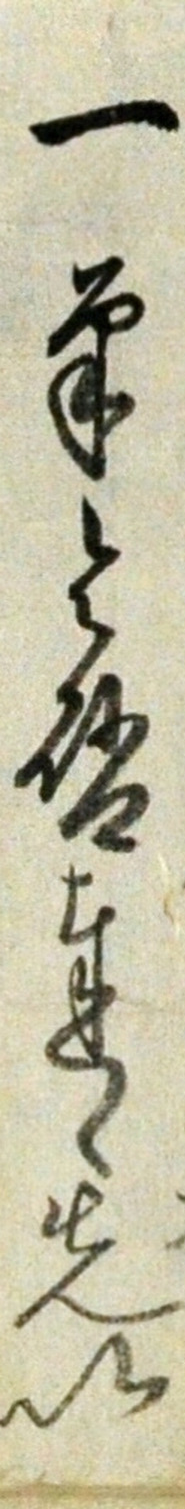一筆令啓達候先以
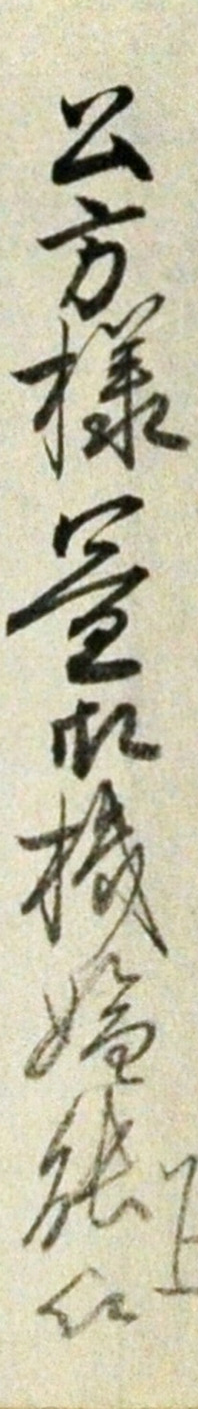公方様益御機嫌能被
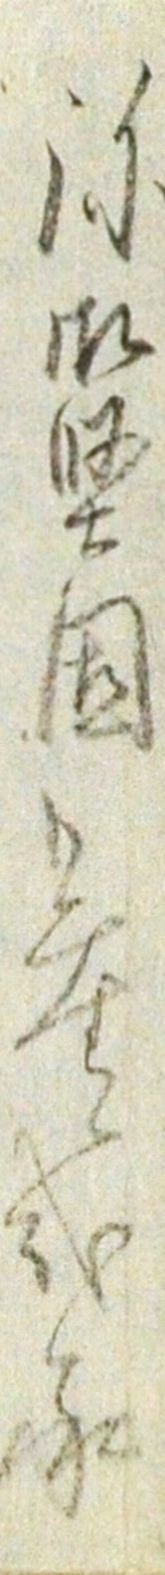弥御堅固御座候哉承
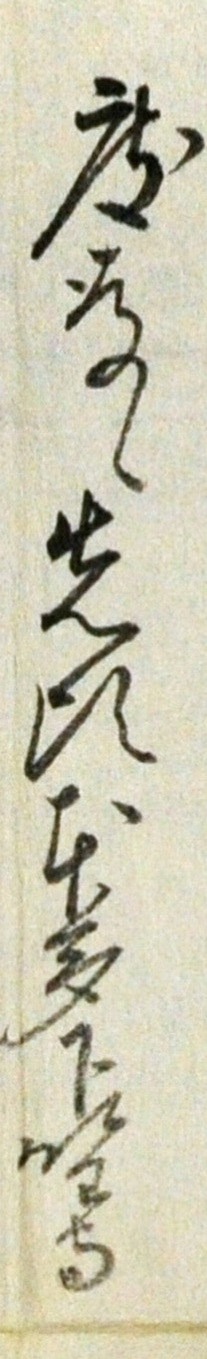度存候先頃本多下野守
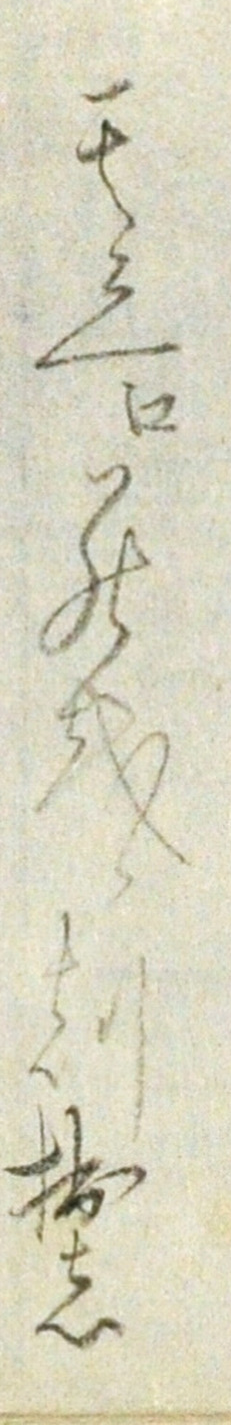其元え罷越候刻拙者
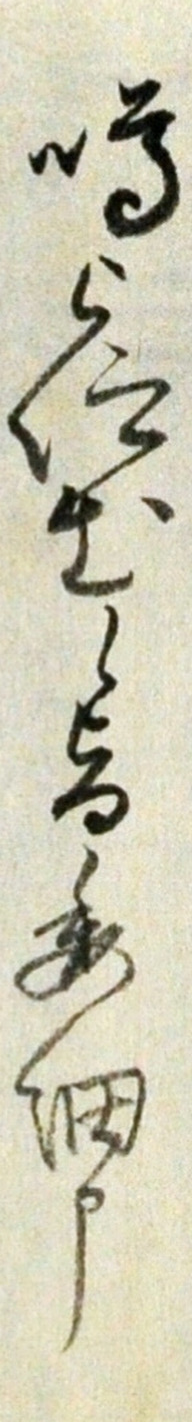噂被仰出之旨委細申
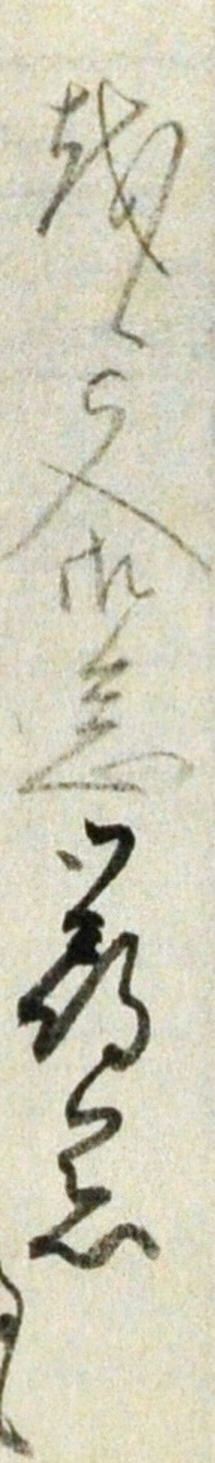越候被入御念御尋思存候
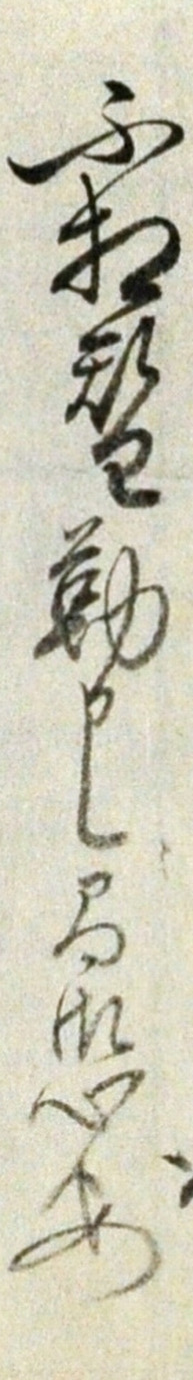不相替勤申候間御心安
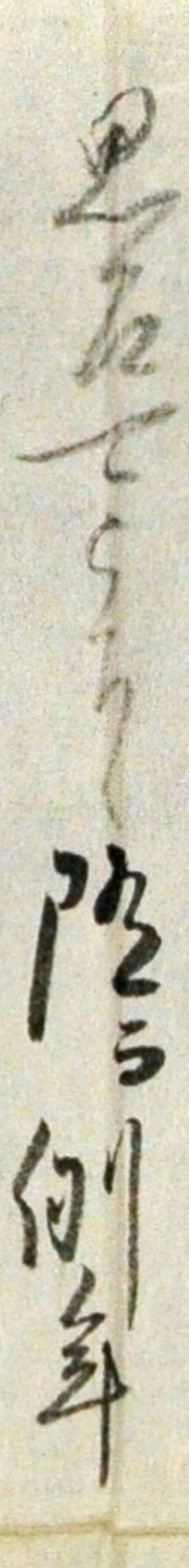思召可被下候随て例年
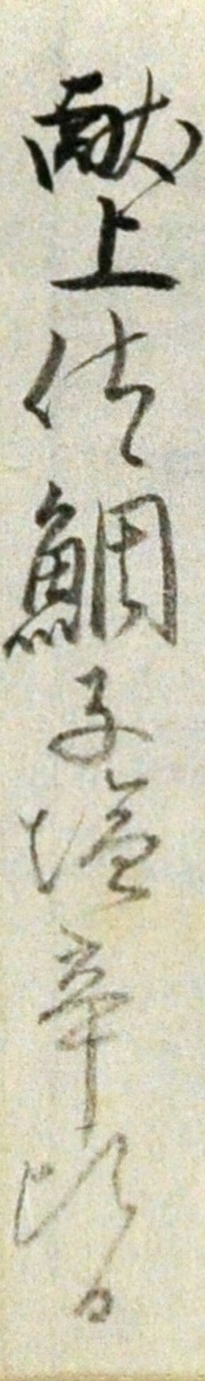献上仕候鯛子塩辛頃日
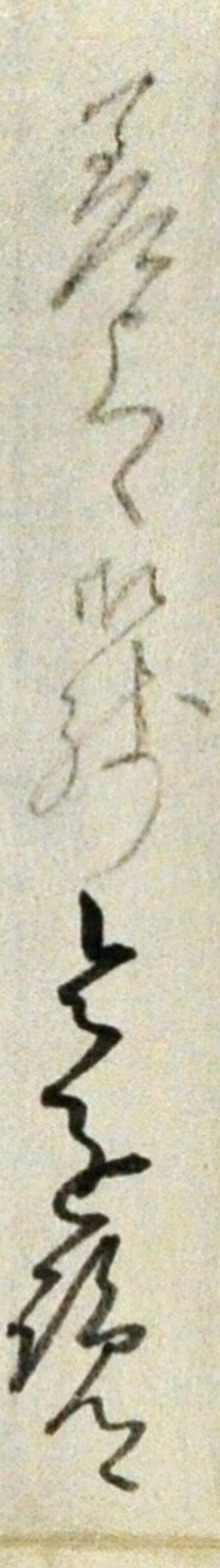差上候御残令進覧候
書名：書状
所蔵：伊那市立高遠町図書館・合同会社AMANE
